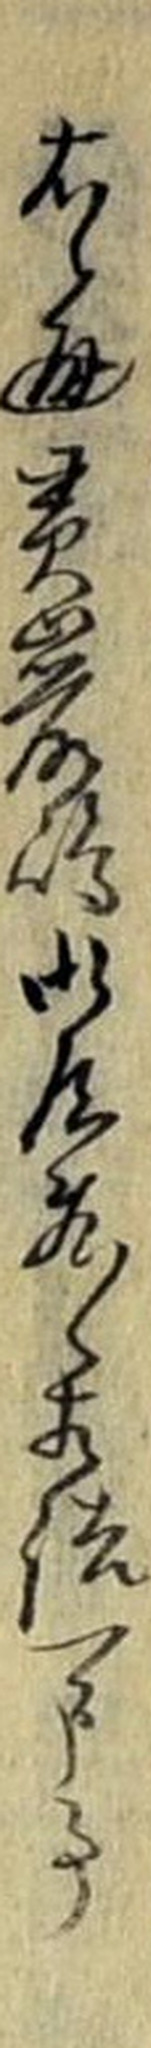右之通灵厳嶋御屋敷へ相詰可申事
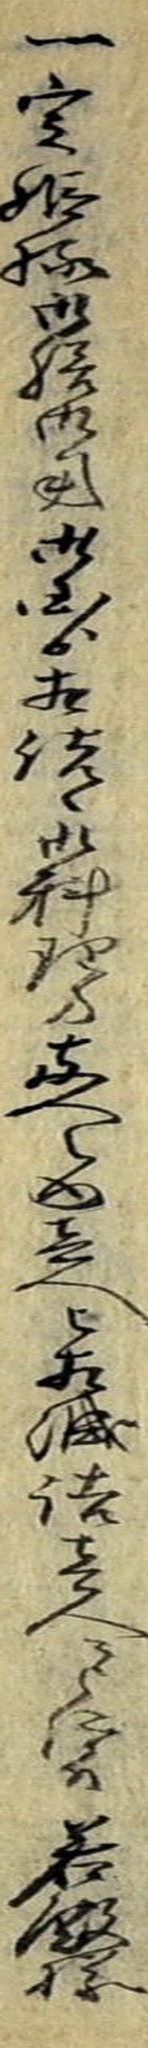一定姫様御膳御用御国ゟ相詰候御料理方両人之内壱人被相減詰壱人ニ被仰付若殿様
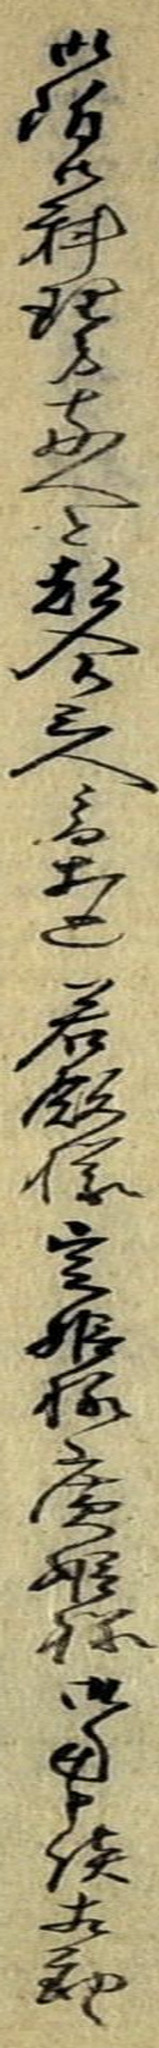御付御料理方両人と都合三人ニ而打込若殿様定姫様広姫様御用申談相勤候
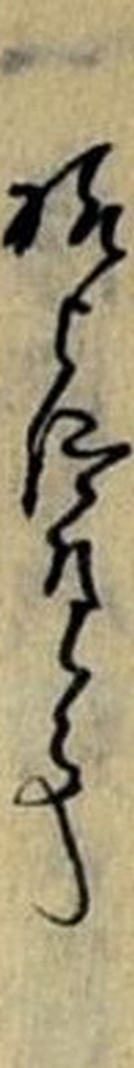様被仰付候事
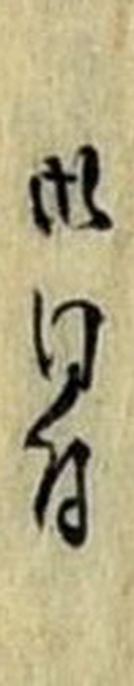御目付
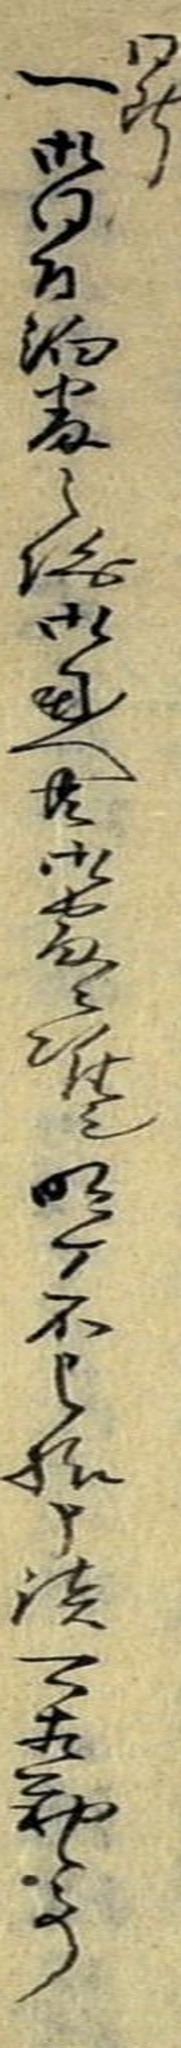一御目付泊番之儀御用人共御番ニ准シ明ケ不申候様申談可相勤候事
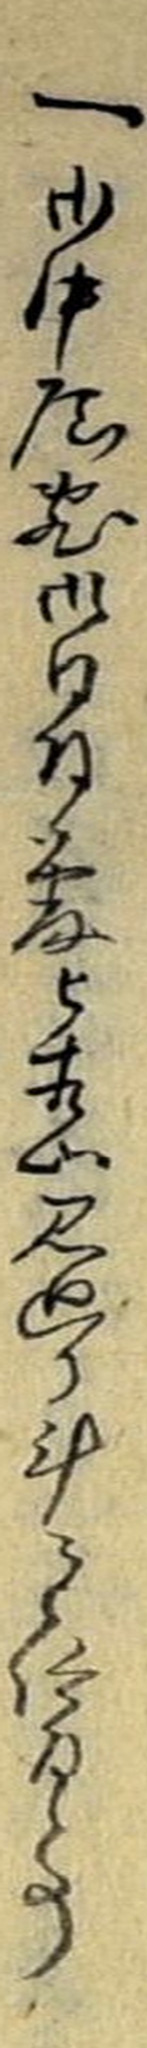一御中屋敷御目付御番被相止見廻り斗ニ被仰付候事
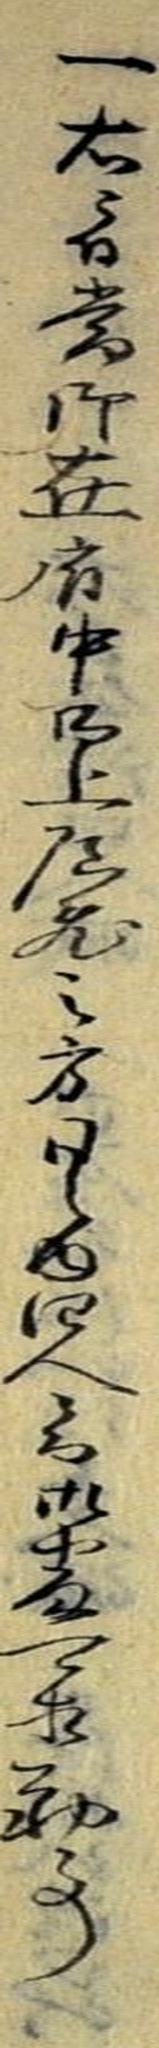一右ニ付当御在府中御上屋敷之方日之内四人ニ而御番可相勤事
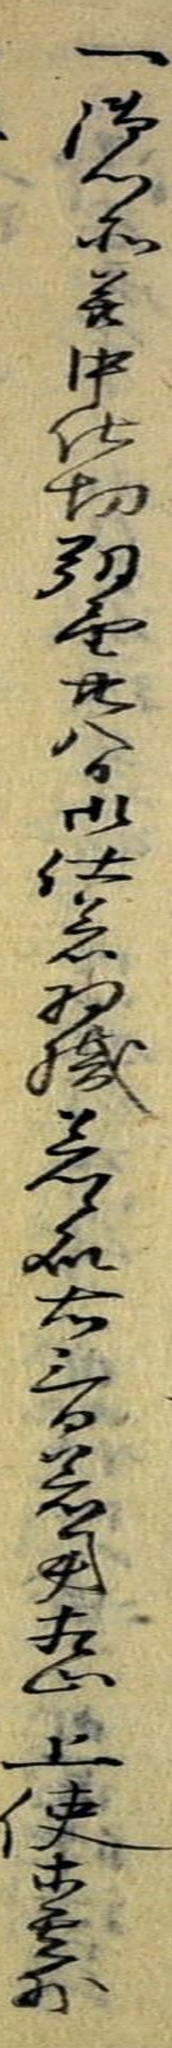一御門所并中仕切朔望廿八日御仕着羽織着候処右三日着用相止上使等其外
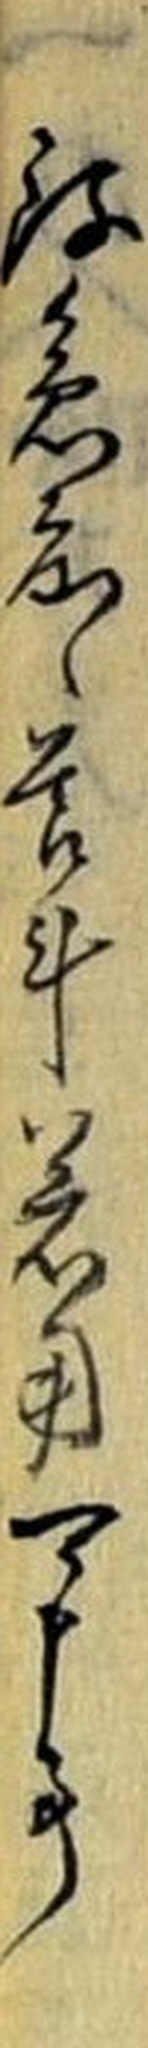致急候節斗着用可申事
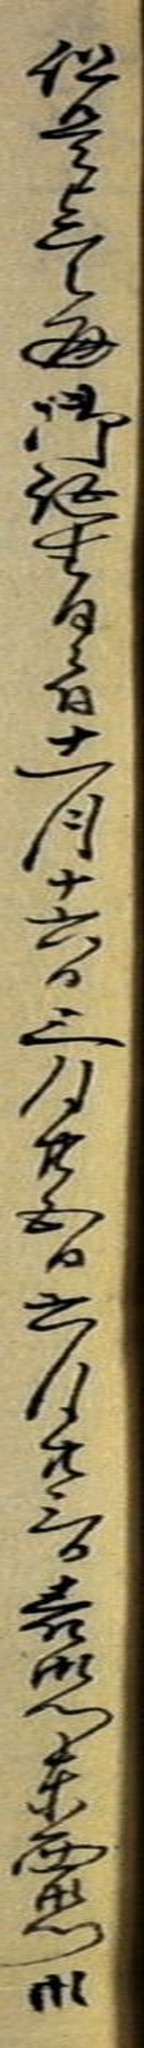但是迄之通御誕生日ニ付十一月十六日三月廿五日六月廿三日表御門東西御門御
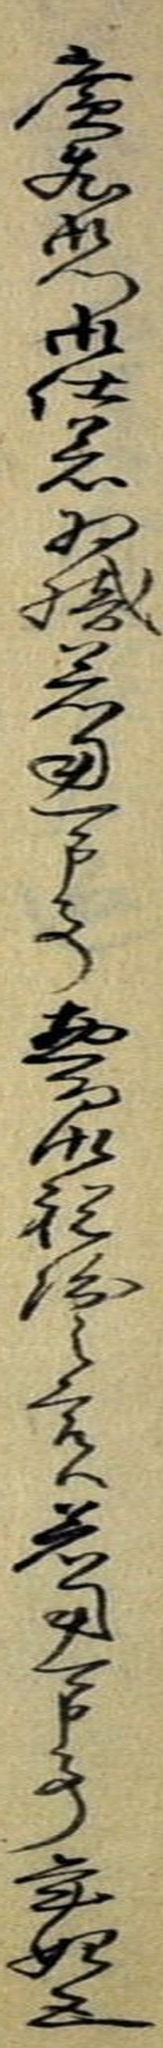広敷御門御仕着羽織着用可申事惣而御祝儀之節ハ着用可申事年始五
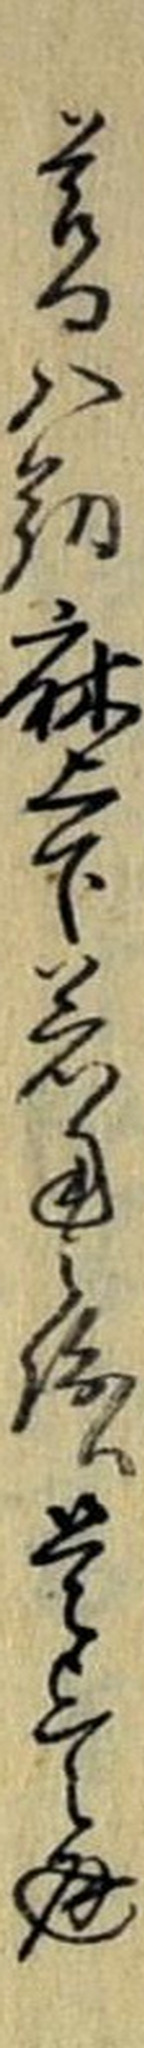節句八朔麻上下着用之儀ハ是迄之通
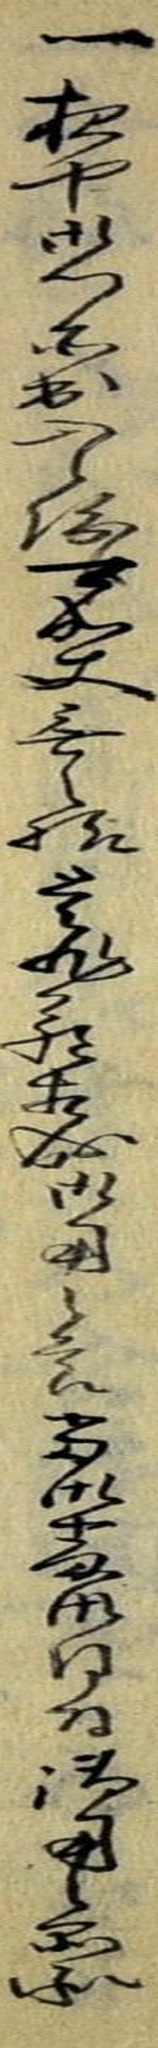一夜中御門所出入之儀可成丈無之様是非難相成御用之節当御番御目付御用之品承
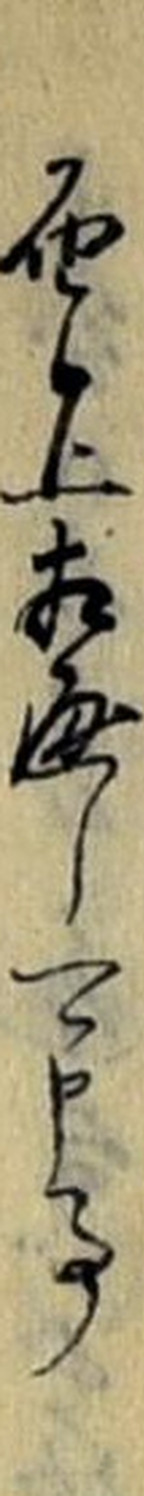届申上相通し可申事
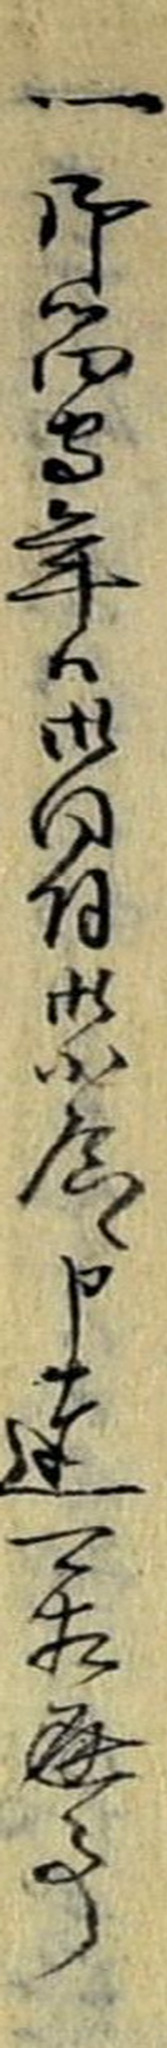一御留守年ハ御目付御小屋へ申達可相通事
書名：命令之部 三
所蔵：福井県文書館 Fukui Prefectural Archives
